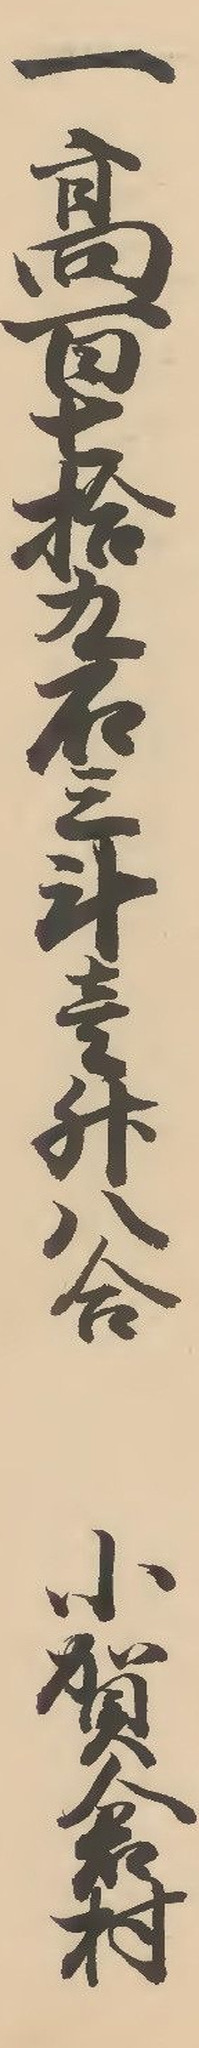一髙百七拾九石三斗壱升八合小賀倉村

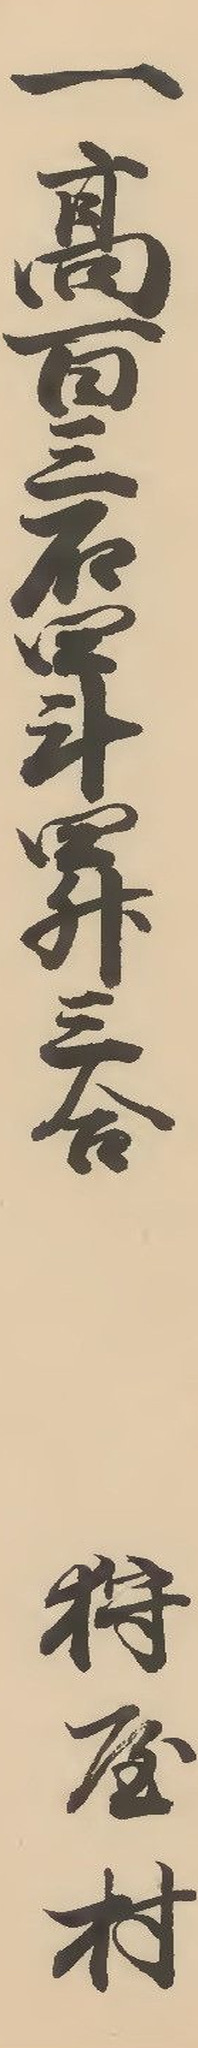一髙百三石四斗四斗三合狩屋村
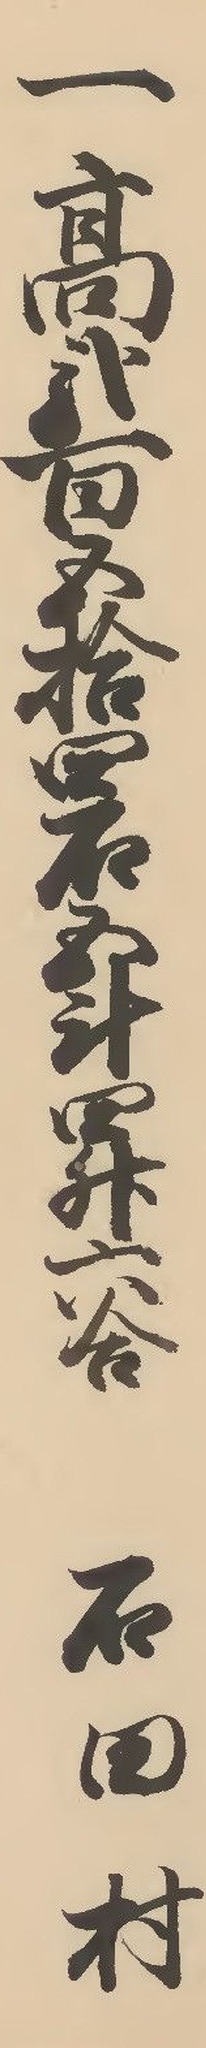一髙弐百五拾四石五斗四升六合石田村
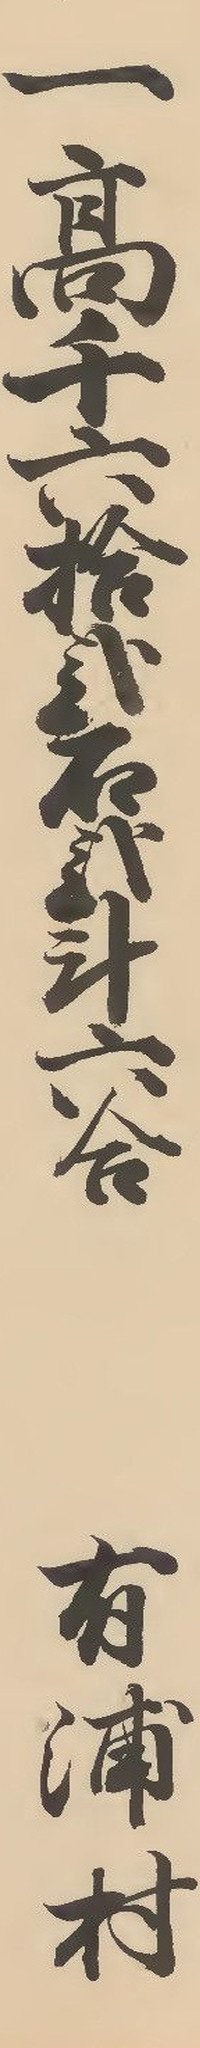一髙千六拾弐石弐斗六合有浦村
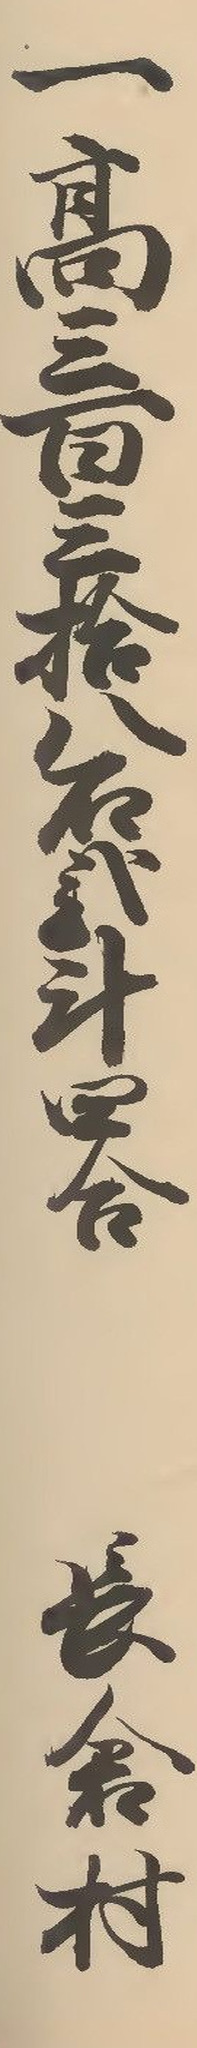一髙三百三拾八石弐斗四合長倉村
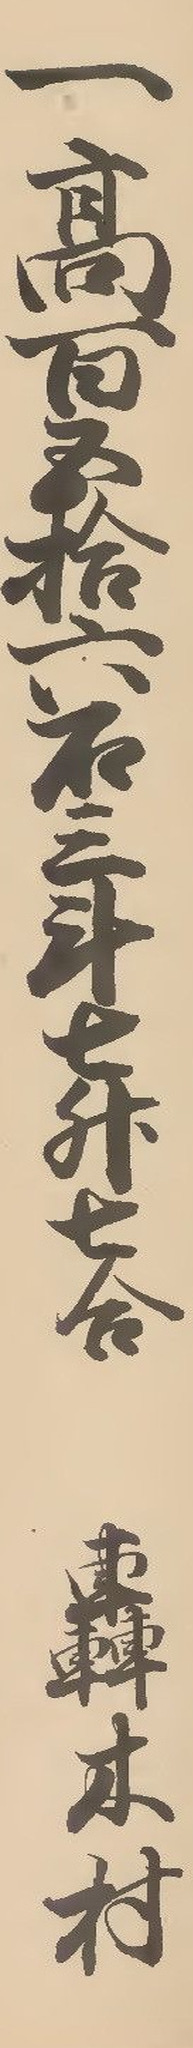一髙百五拾六石三斗七升七合轟木村
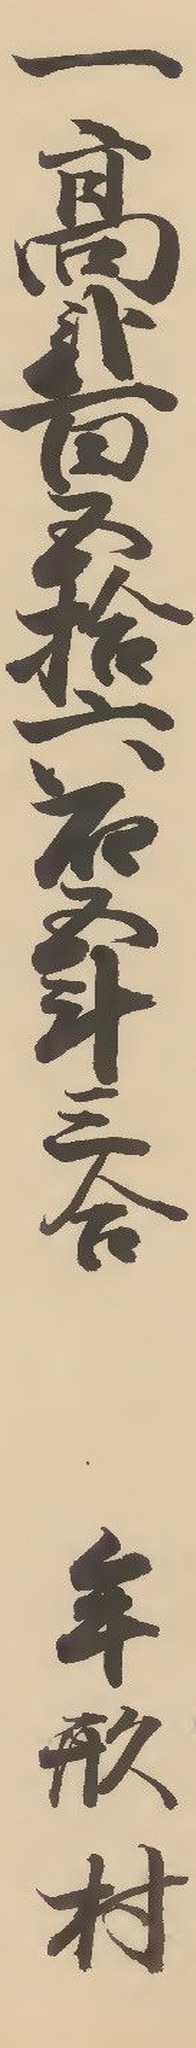一髙弐百五拾六石五斗三合年形村
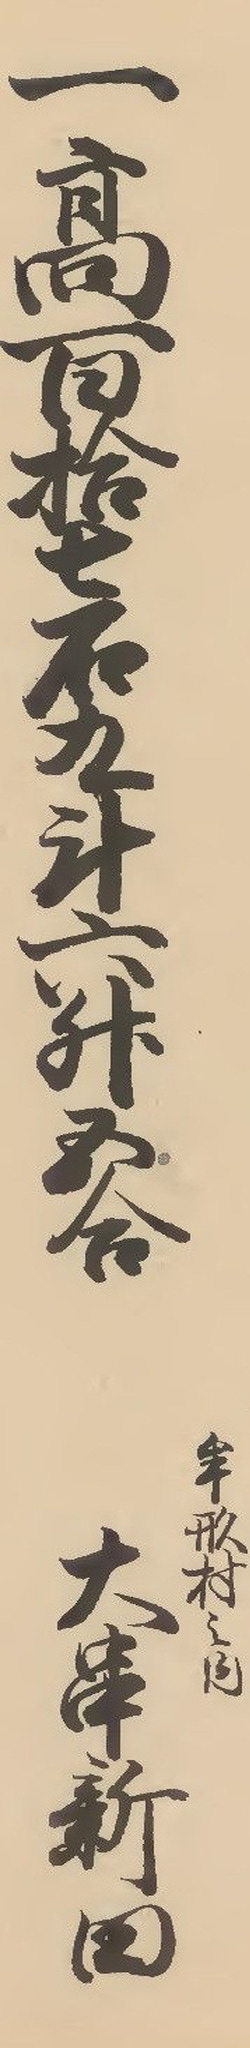一髙百拾七石九斗六升五合大串新田
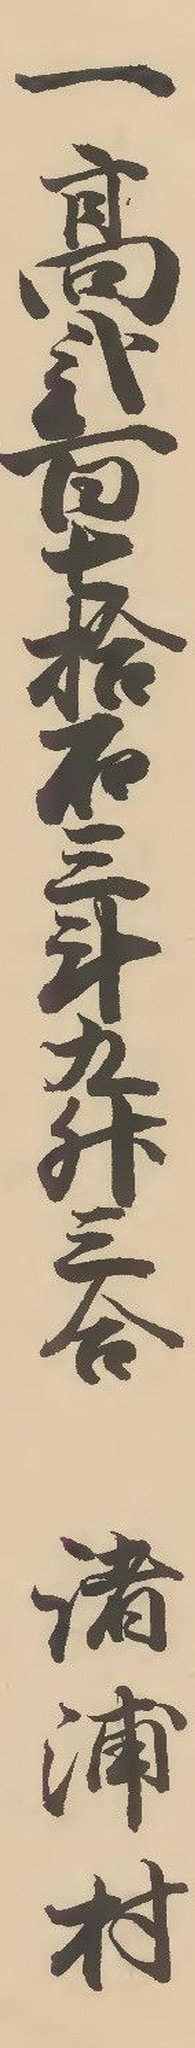一髙弐百七拾石三斗九升三合諸浦村

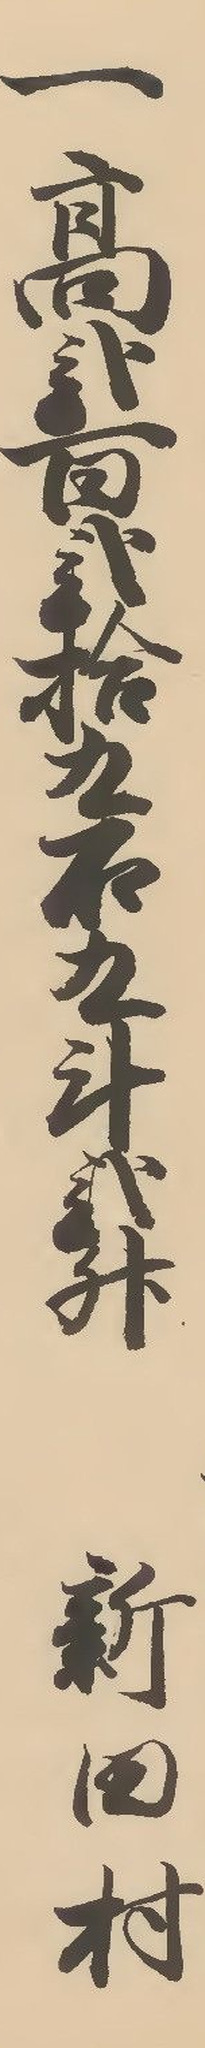一髙弐百弐拾九石九斗弐升新田村
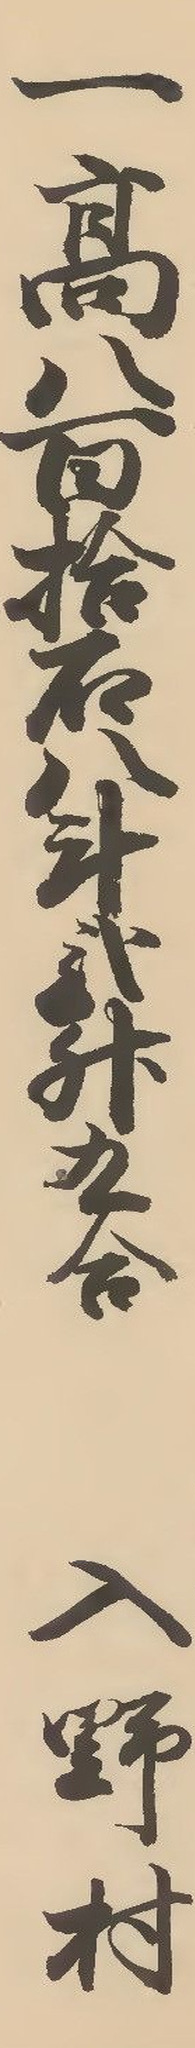一髙八百拾石八斗弐升九合入野村
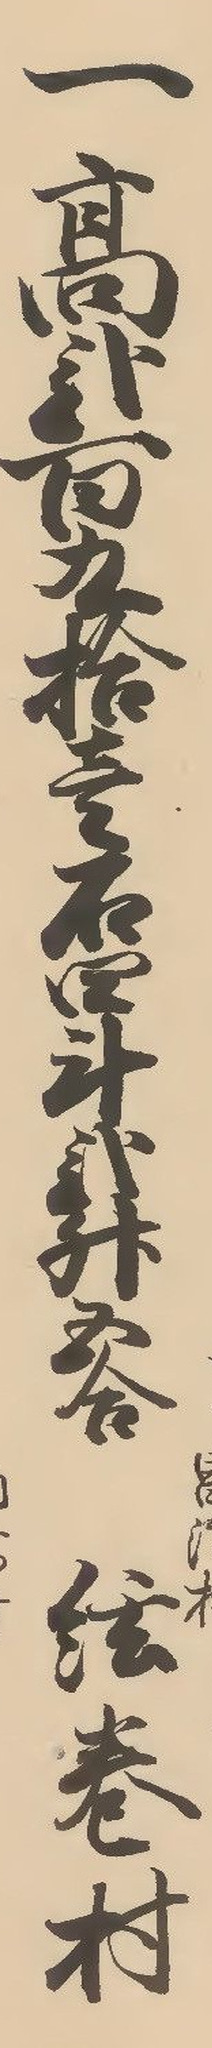一髙弐百九拾壱石四斗弐升五合弦巻村
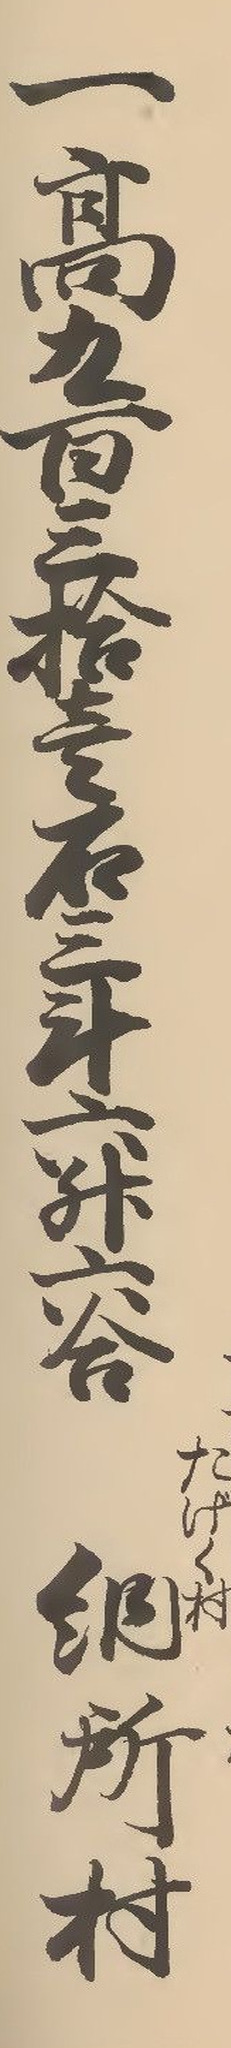一髙九百三拾壱石三斗六升六合納所村
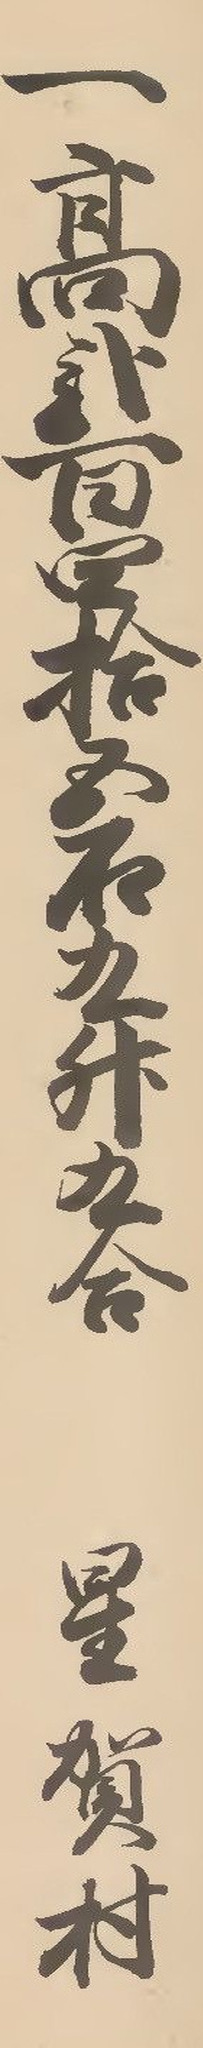一髙弐百四拾五石九升九合星賀村
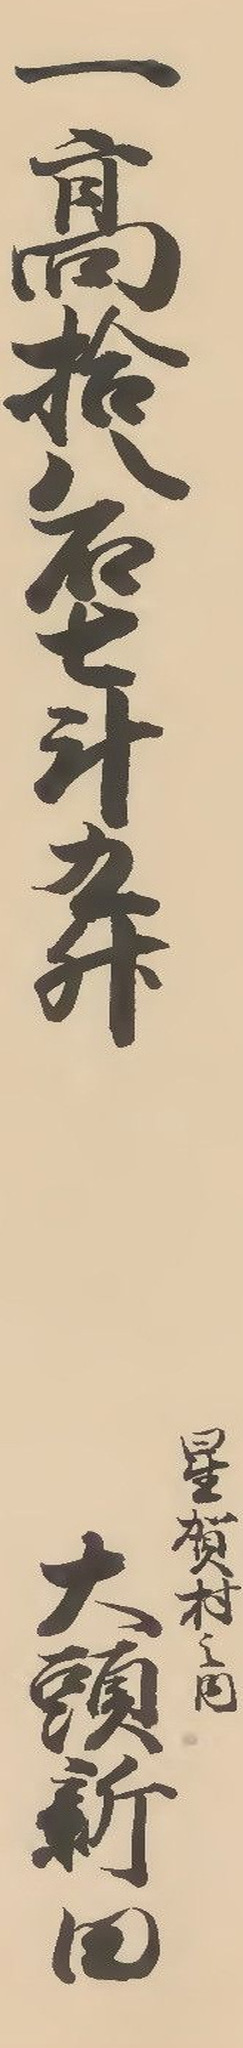一髙拾八石七斗九升大頭新田
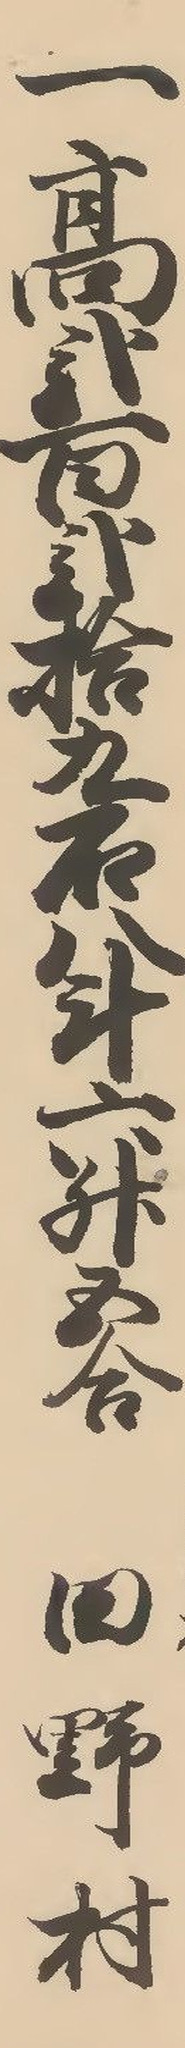一髙弐百弐拾九石八斗六升五合田野村
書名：肥前国郷帳
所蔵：国立公文書館 National Archives of Japan
